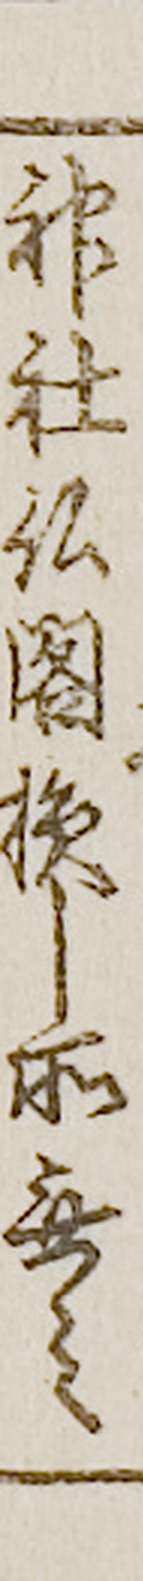神社仏閣損じ所無之
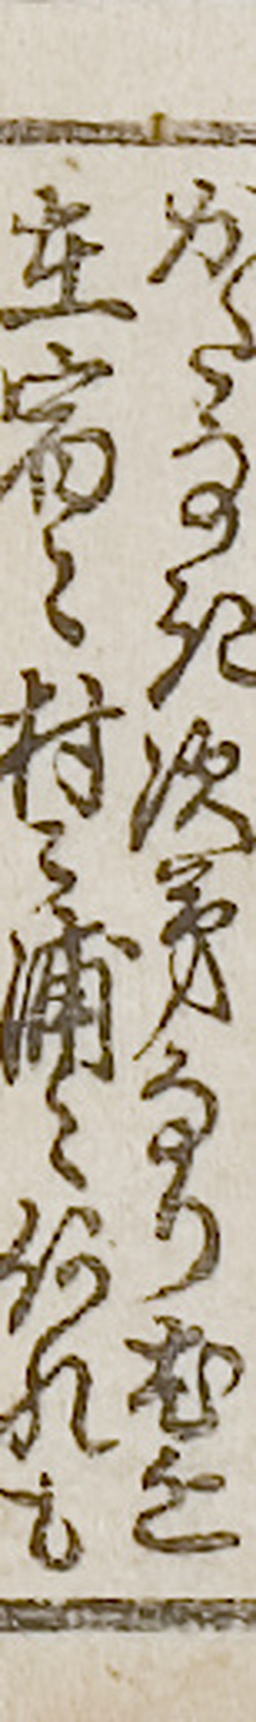在宿々村々浦々何れも
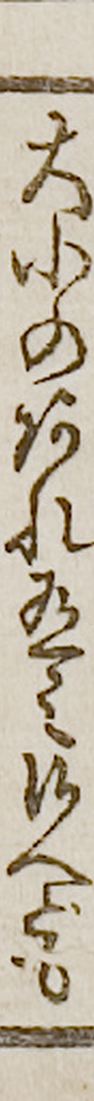大小のあれ有之候へども
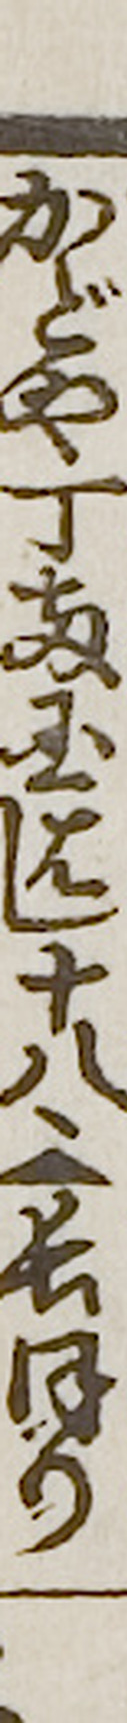かどや丁両国はし十八ヽ▲長ほり
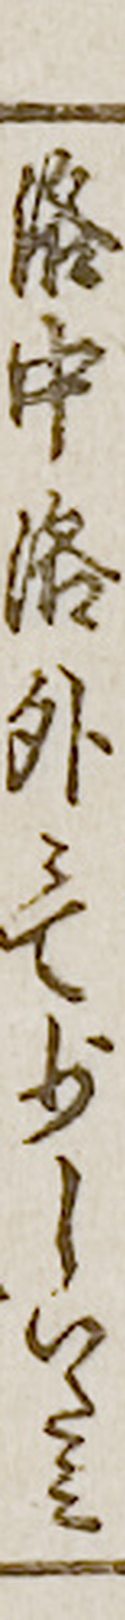洛中洛外にて少しいたみ
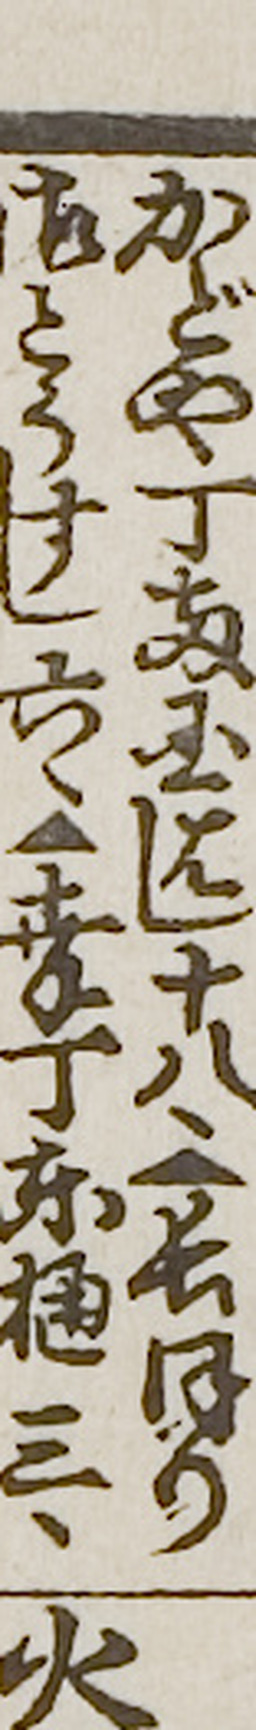御とうすし六ヽ▲幸丁東樋三ヽ
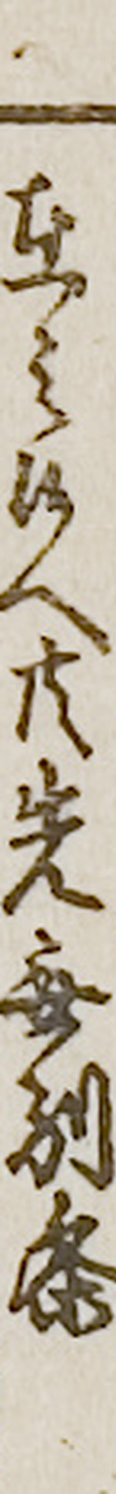在之候へ共先無別条
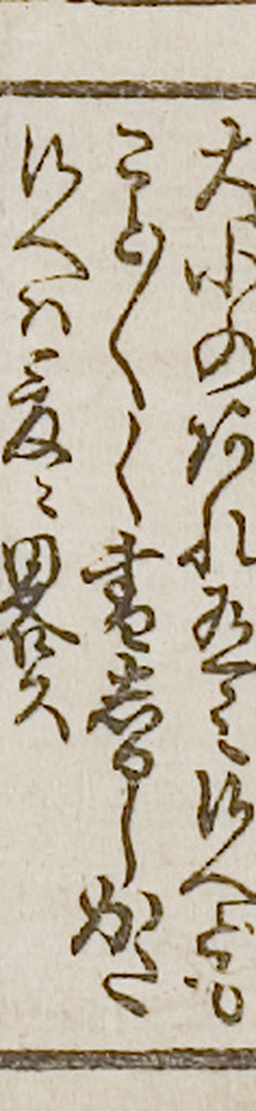こと〳〵く書しるしかた
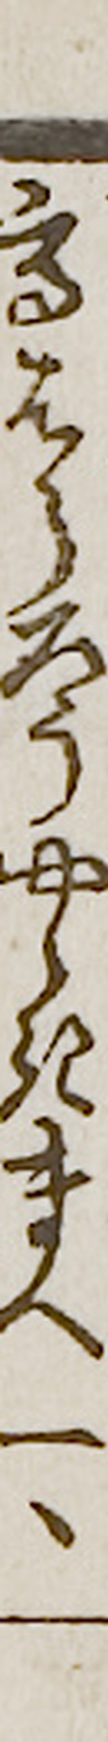高はらろうやしきまへ一ヽ
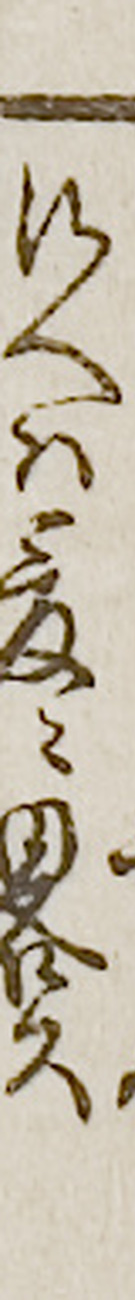候へは爰に略す
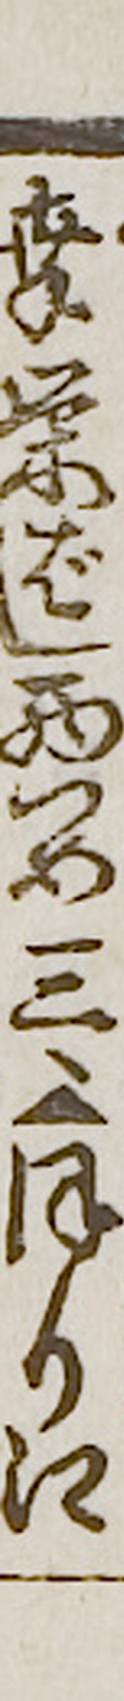幸栄ばし西つめ三ヽ▲ほり江
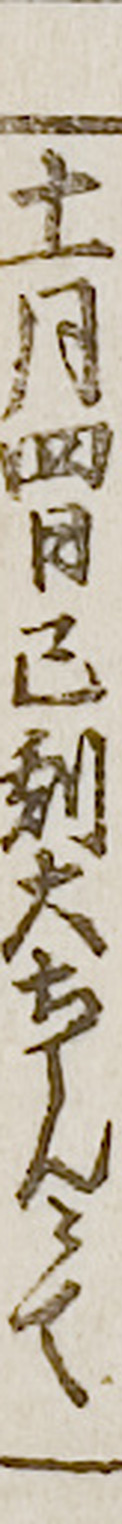十一月四日巳刻大ちしんにて
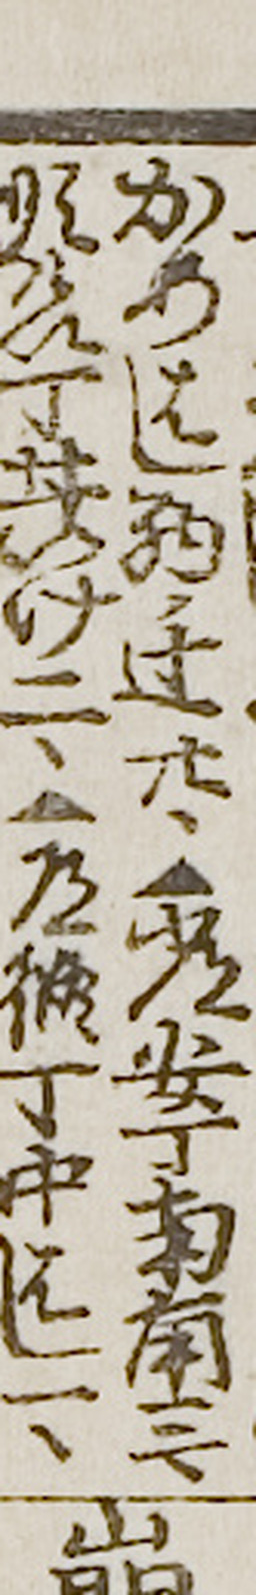順けい丁丼いけ二ヽ▲道修丁中はし一ヽ
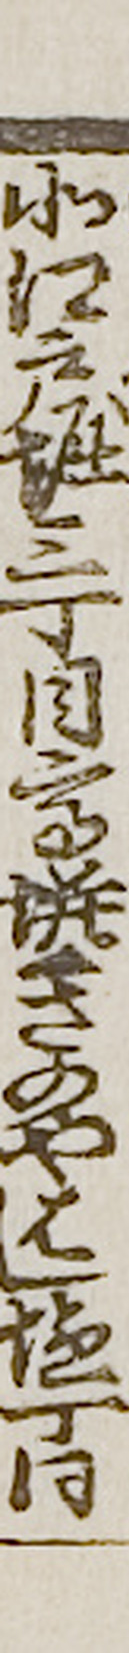北江戸堀三丁目高垪▲さのやはし塩丁同
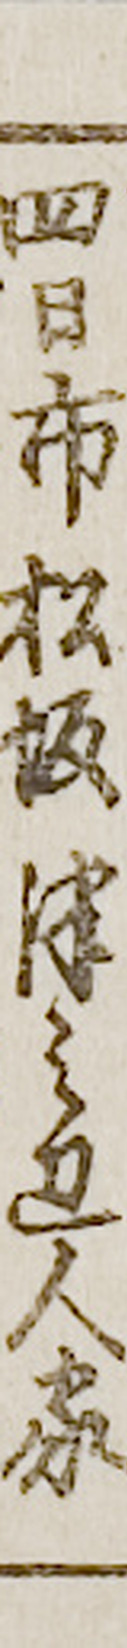四日市松坂津之辺人家
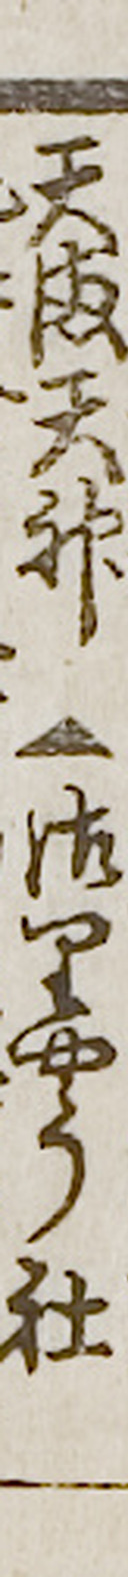天満天神▲御りやう社
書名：大阪大地震一覧
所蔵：東京大学総合図書館 General Library in the University of Tokyo, JAPAN
